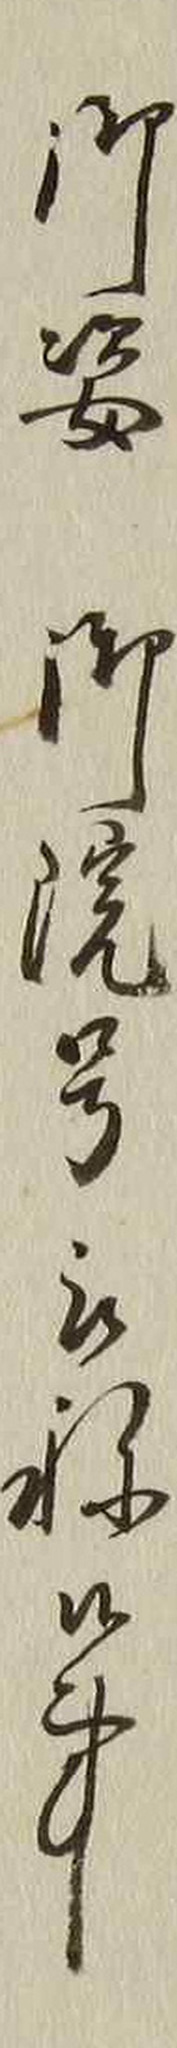御姿御院号被称候事
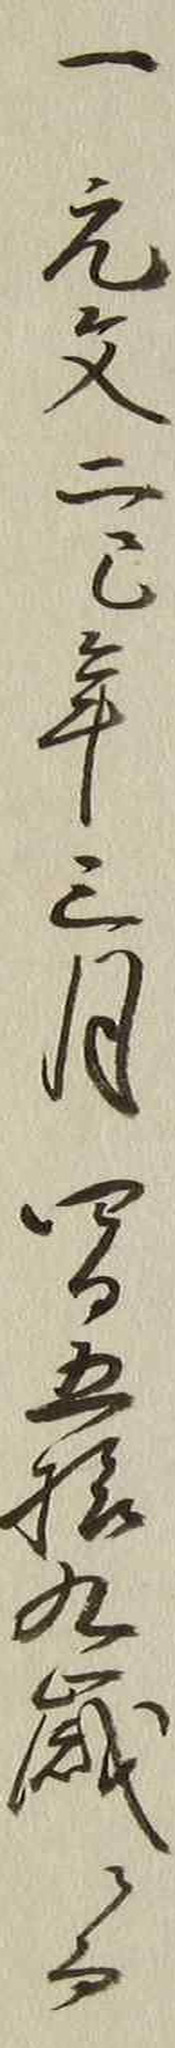一元文二巳年三月四日五拾九歳ニ而
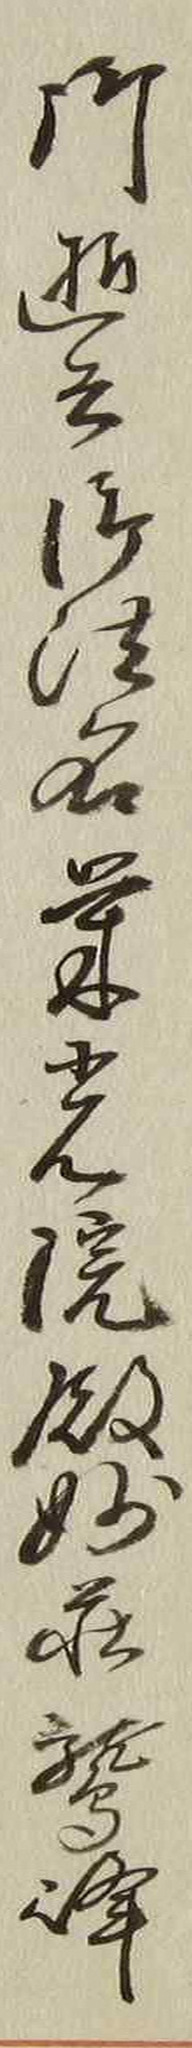御逝去御法名栄光院殿妙荘鷲峰
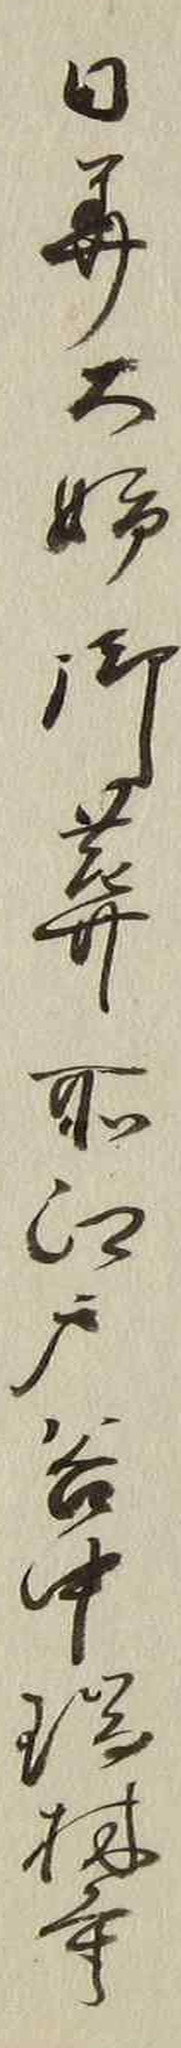日華大姉御葬所江戸谷中瑞林寺
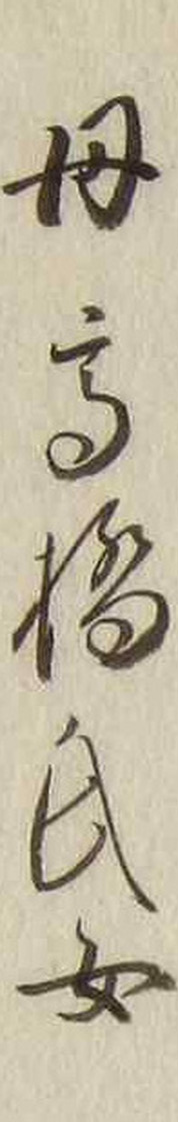母高橋氏女

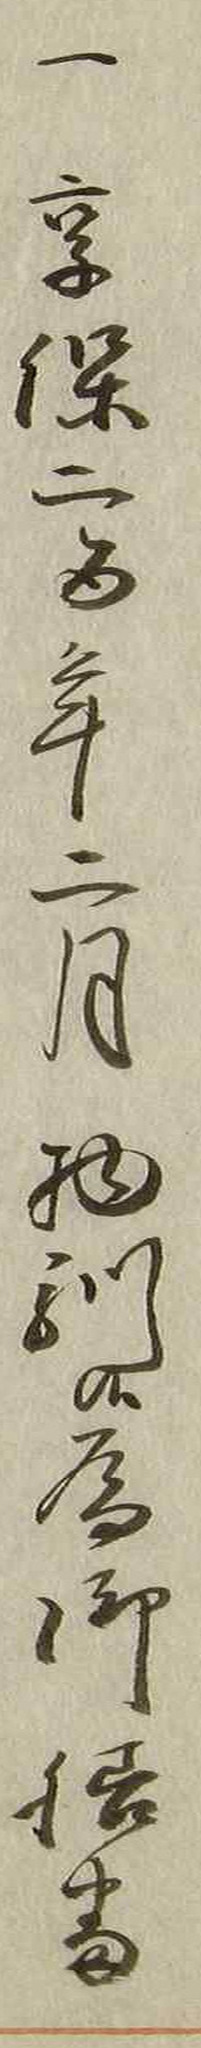一享保二酉年二月物馴候為御膳番
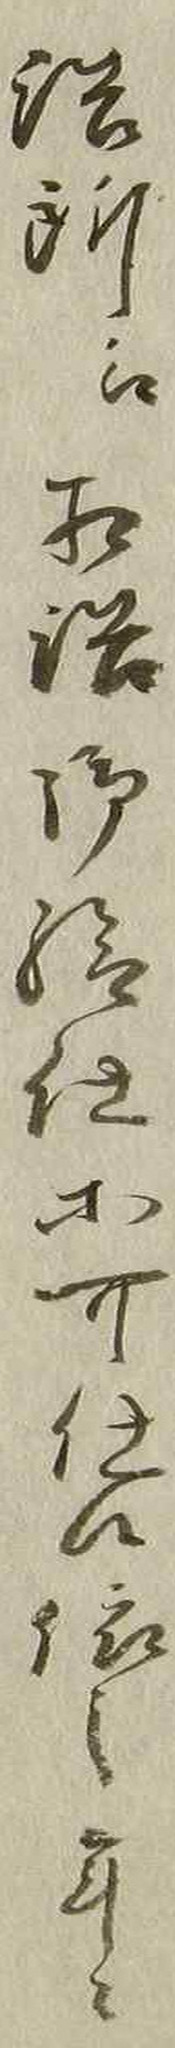詰所江相詰御給仕等可仕候依之年々
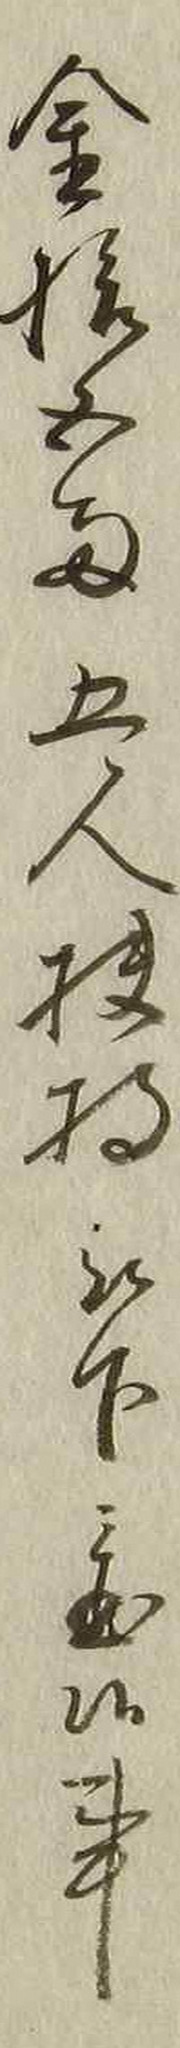金拾五両五人扶持被下置候事
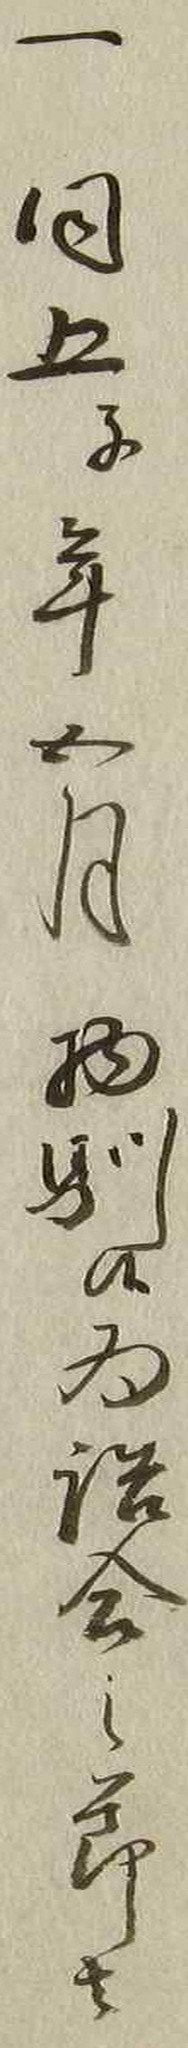一同五子年五月物馴候為詰合之節者
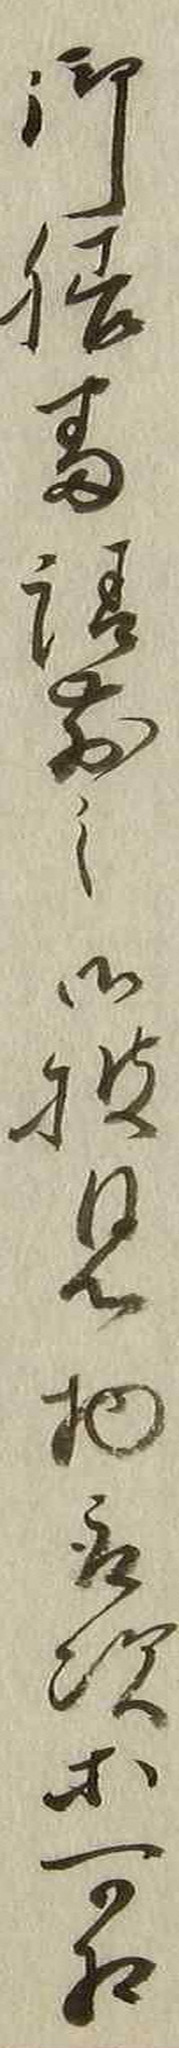御膳番請前之御披見物取次等可相
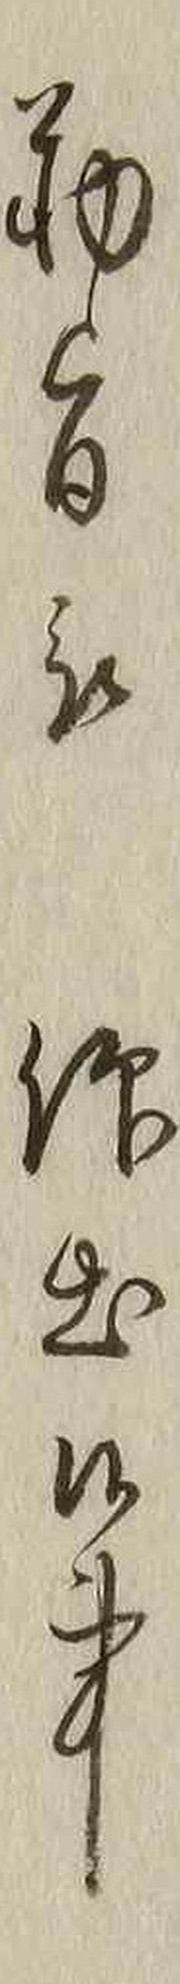勤旨被仰出候事
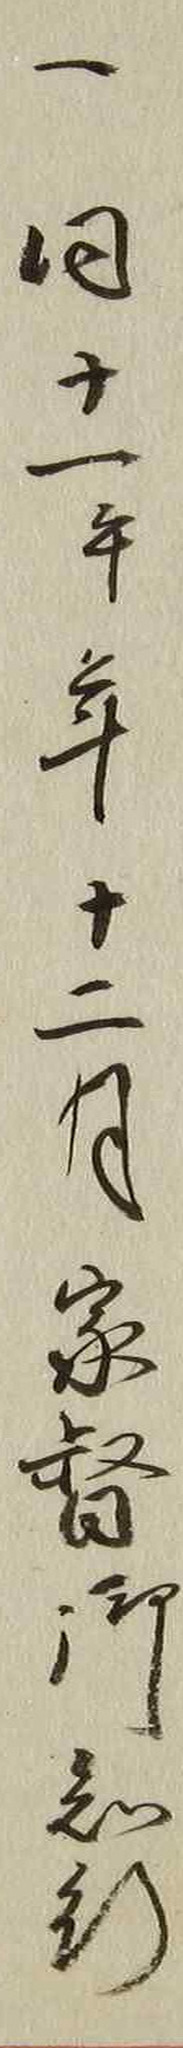一同十一午年十二月家督御知行
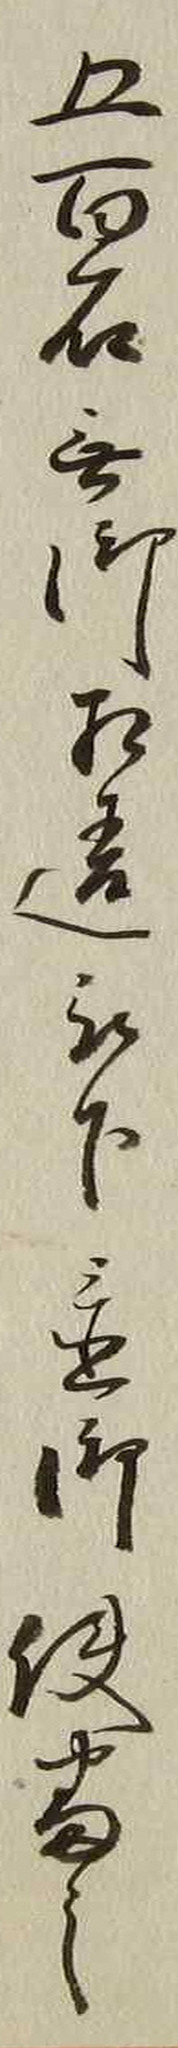五百石無御相違被下置三御使番之
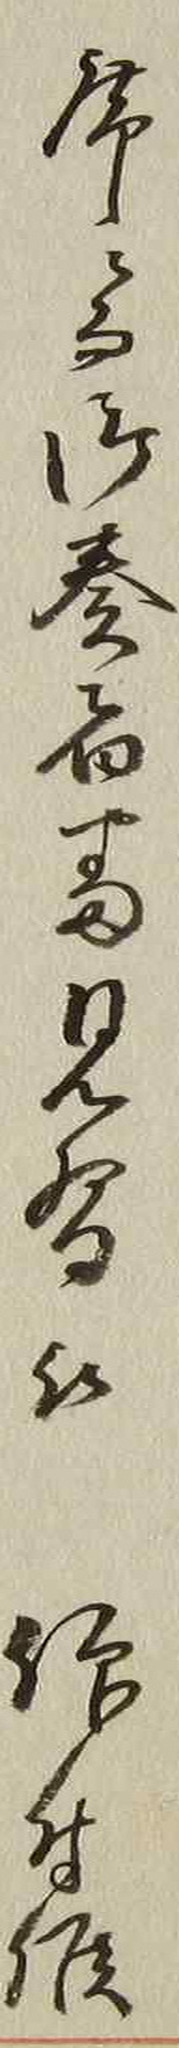席ニ而御奏者番見習被仰付候
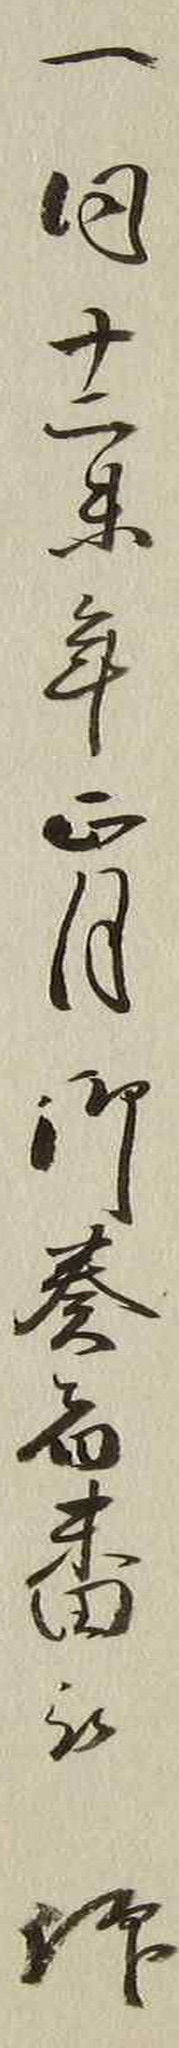一同十二未年正月御奏者番被仰
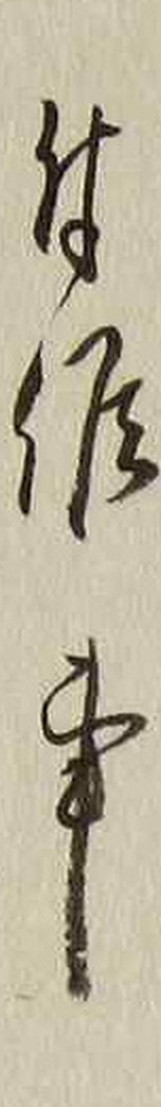付候事
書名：諸士系譜　巻之122　よ之部5
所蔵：会津若松市立会津図書館
